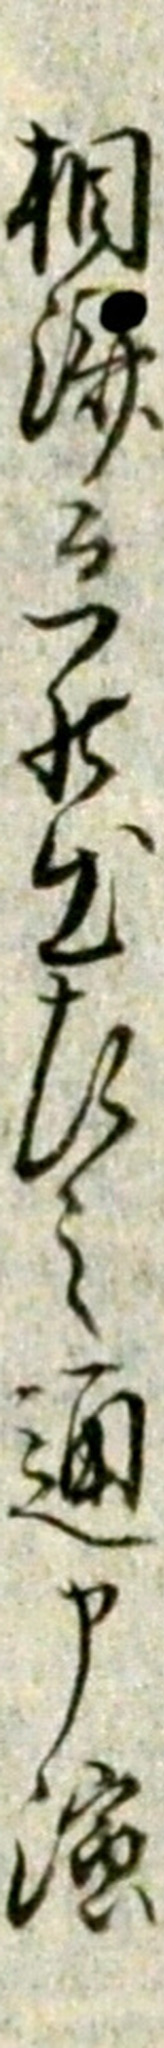相済而罷出左之通申演
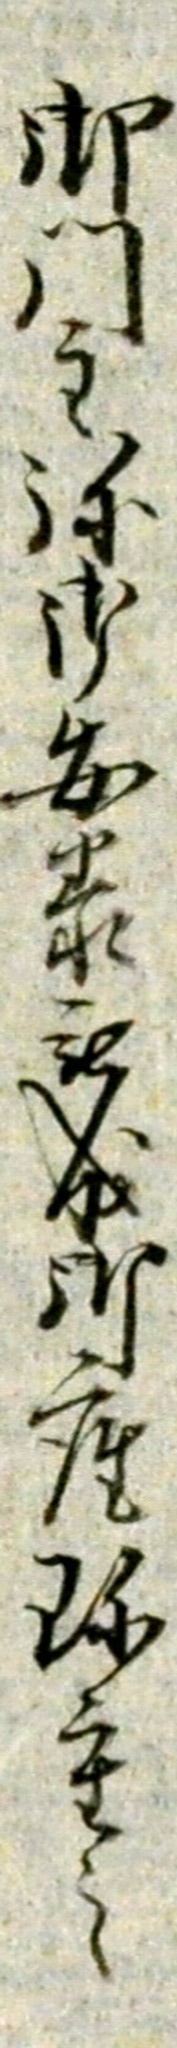御門主弥御安泰被成御座珍重之
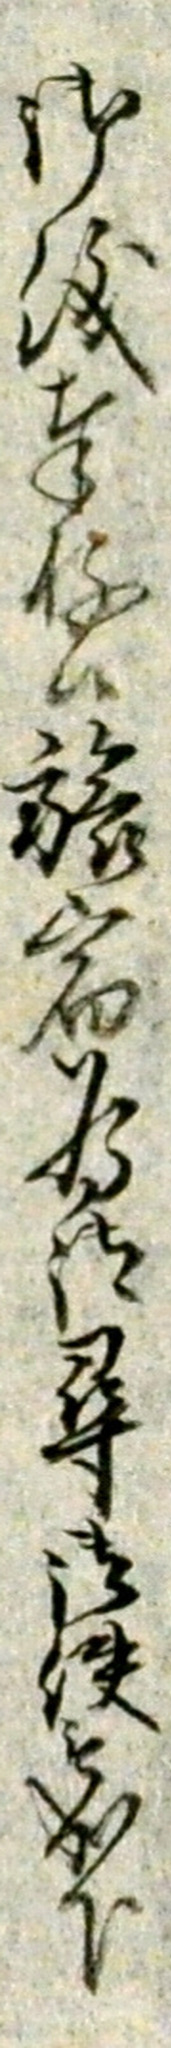御儀奉存候旅宿為跡尋御使被成下
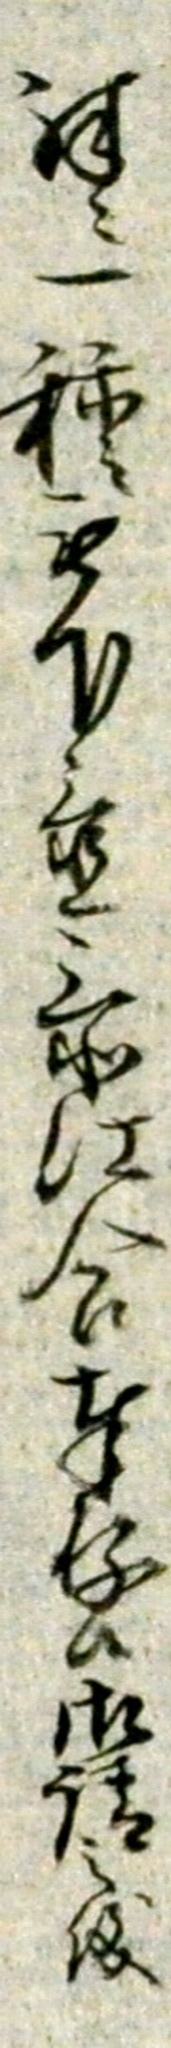殊に一種被下置忝仕合奉存候御請之儀
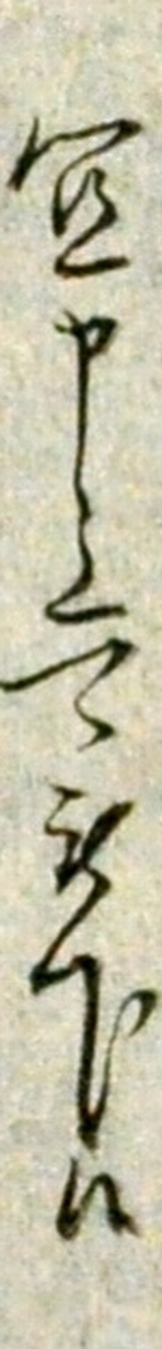宜申上可被下候
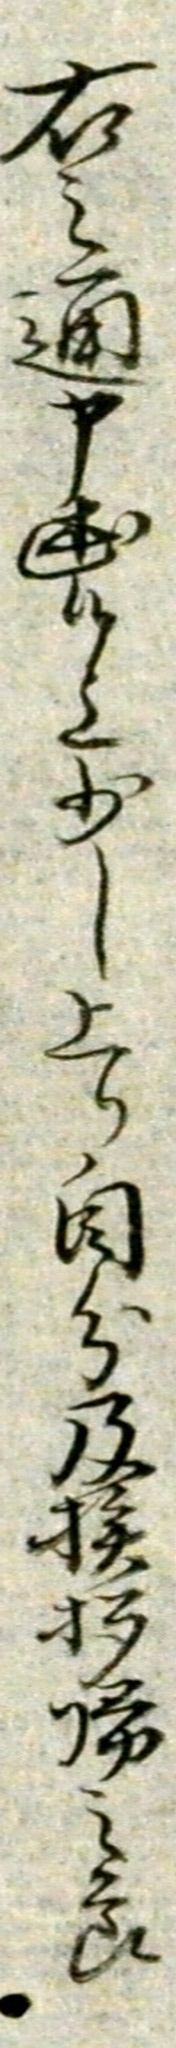右之通申述候上少し上り自分及挨拶帰之節
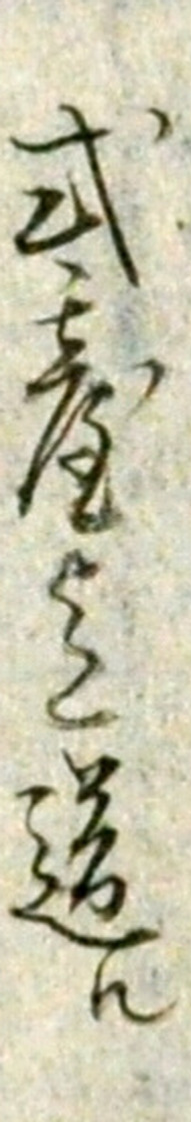式台迄送ル
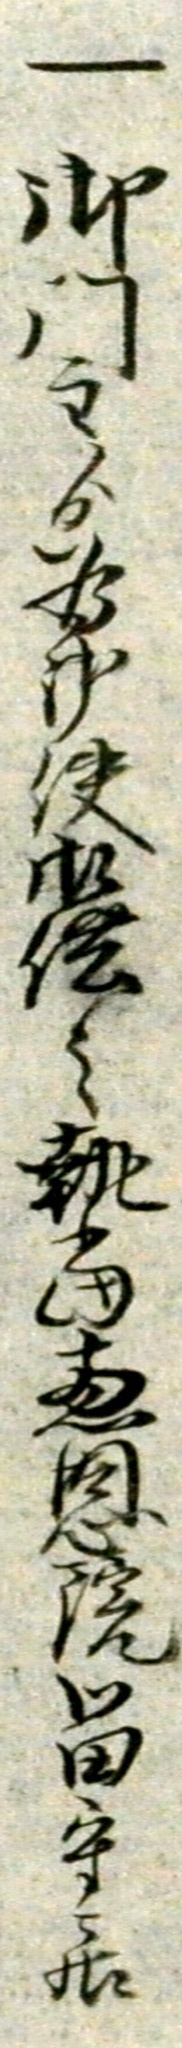一御門主ゟ右御使御供之執当恩院留守居
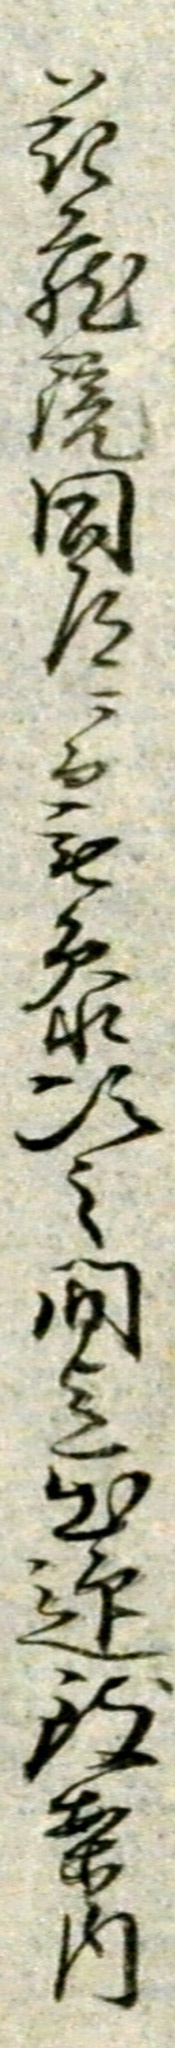花蔵院同道ニ而無忝次之間迄出迎致案内
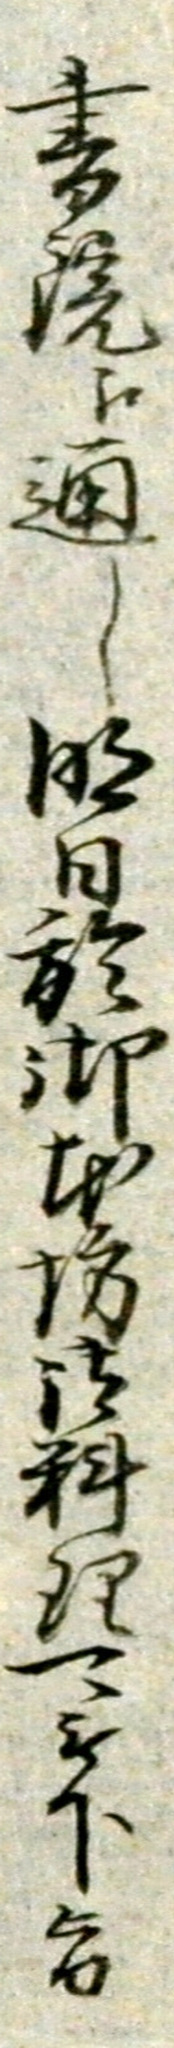書院江通し明日於御本坊御料理可被下旨
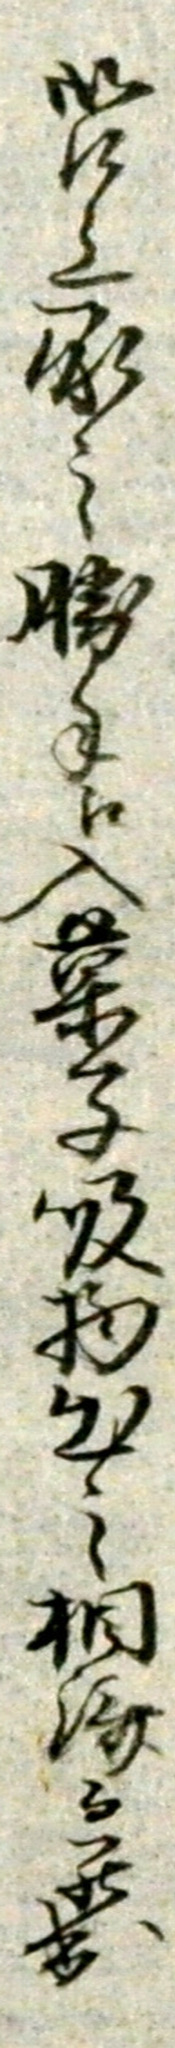以口上承之勝手江入菓子吸物出之相済而罷出

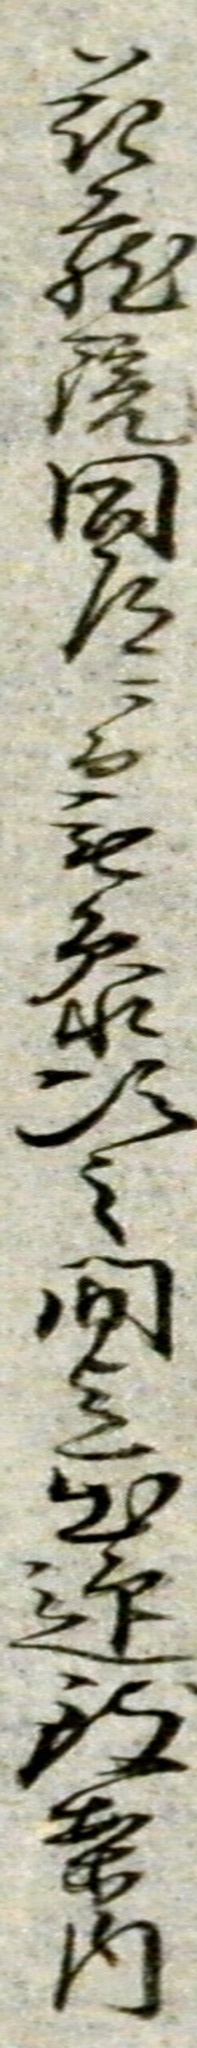花蔵院同道ニ而被参次之迠出迎致案内
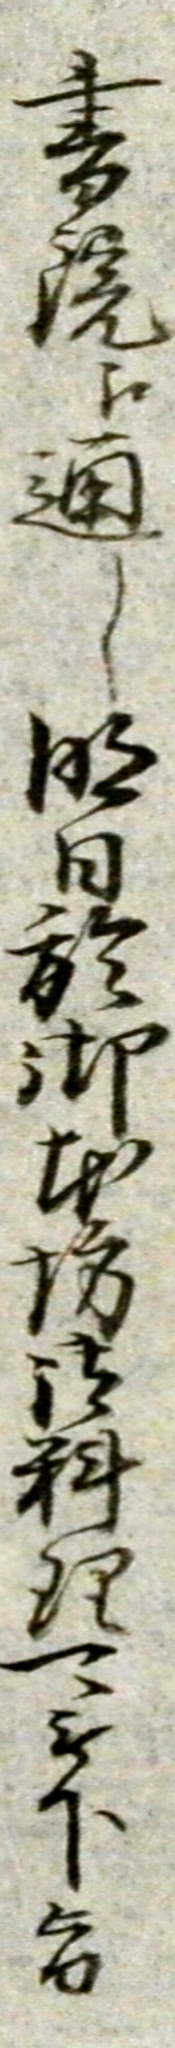書院江通し明日於御本坊御料理可被下旨
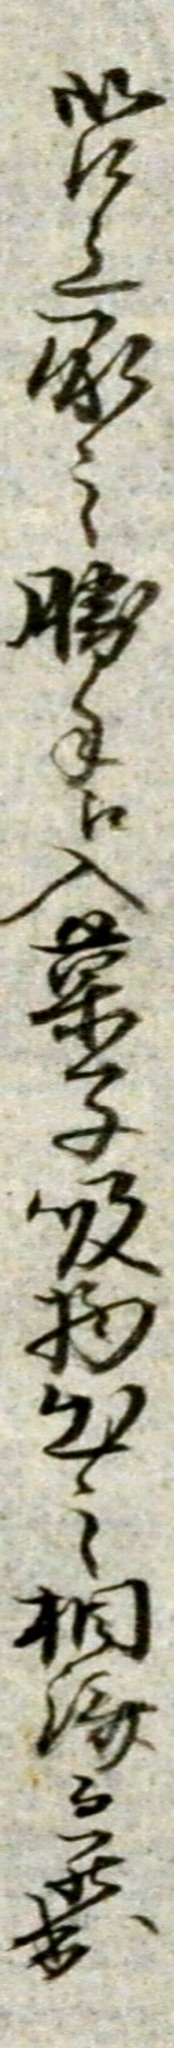御口上承之勝手江入菓子吸物出之相済而罷出
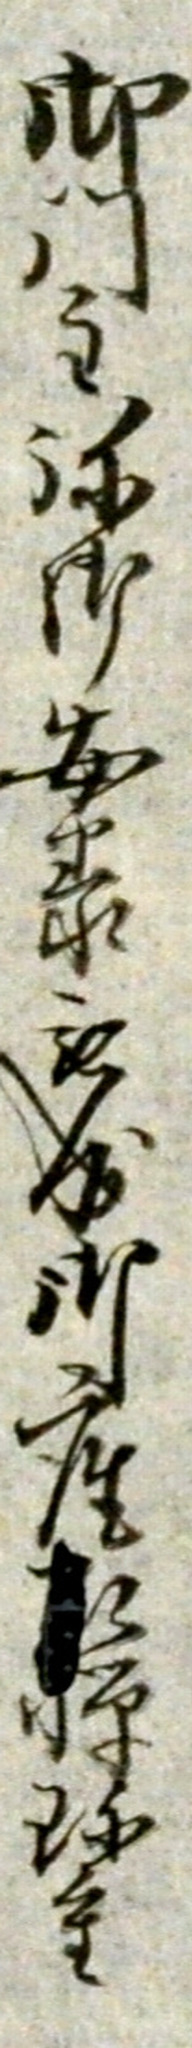御門主弥御安泰被成御座乍憚珍重
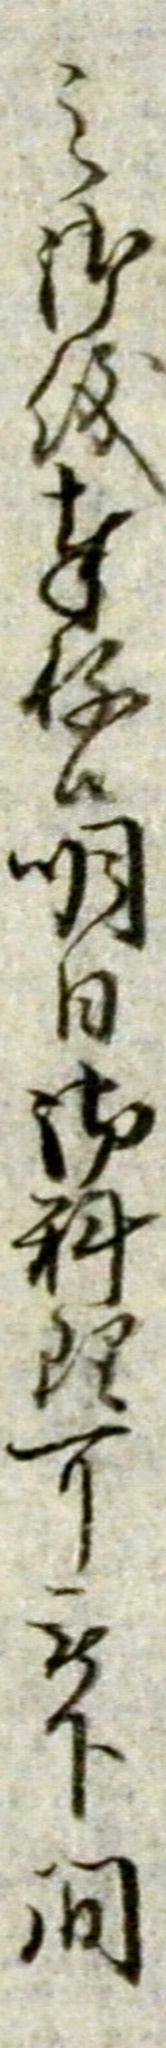之御儀奉存候明日御料理可被下間
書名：日光御名代相勤候節ノ留
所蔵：伊那市立高遠町図書館・合同会社AMANE
